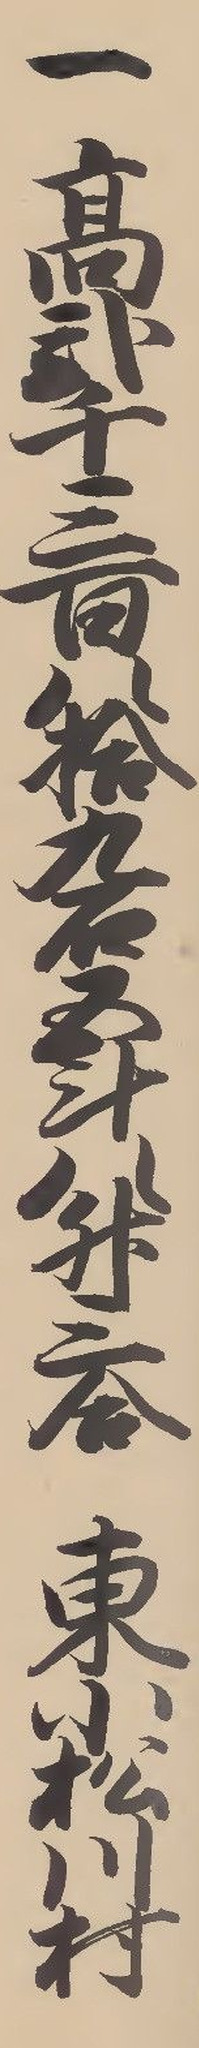一高弐千三百八拾九石五斗八升三合東小松川村
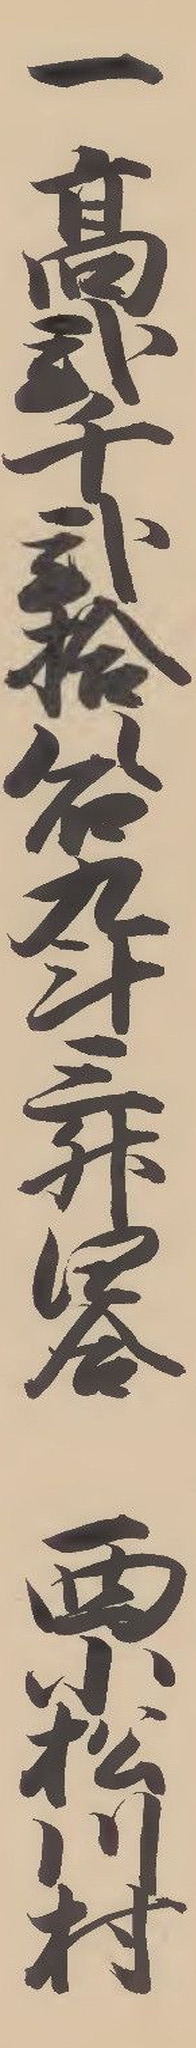一高弐千弐拾八石九斗三升四合西小松川村
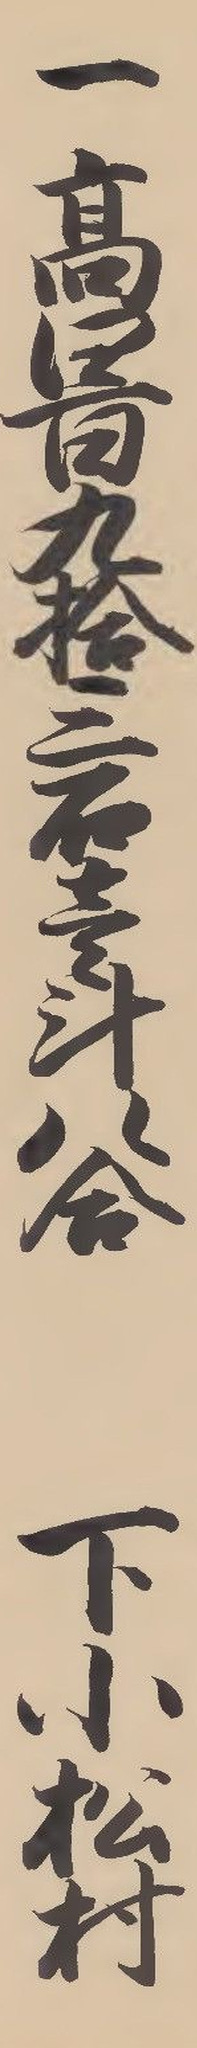一高四百九拾三石壱斗八合下小松村
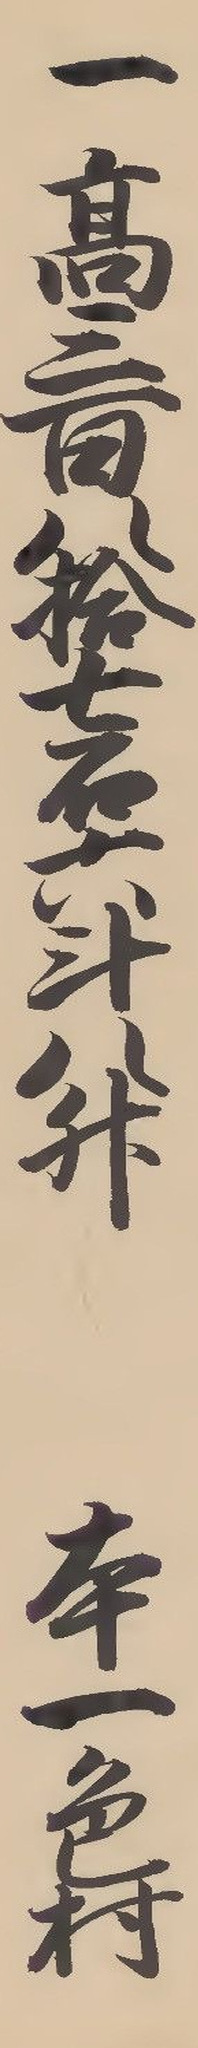一高三百八拾七石六斗八升本一色村

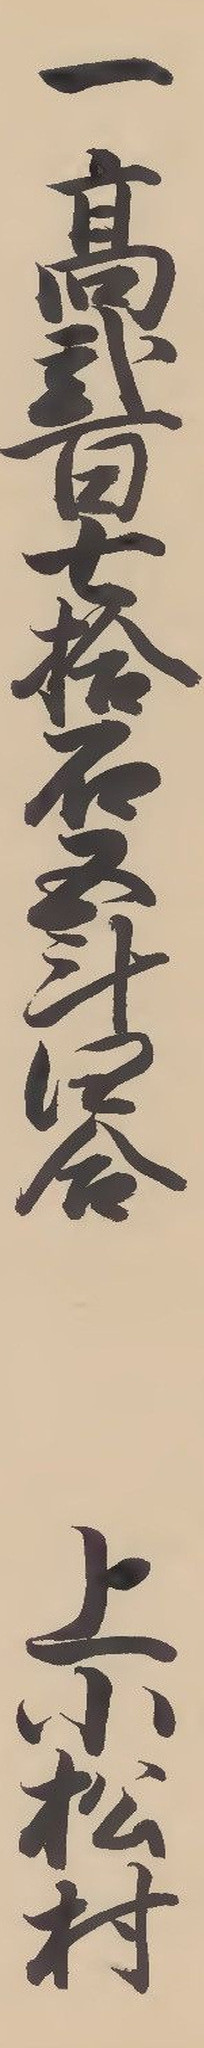一高弐百七拾石五斗四合上小松村
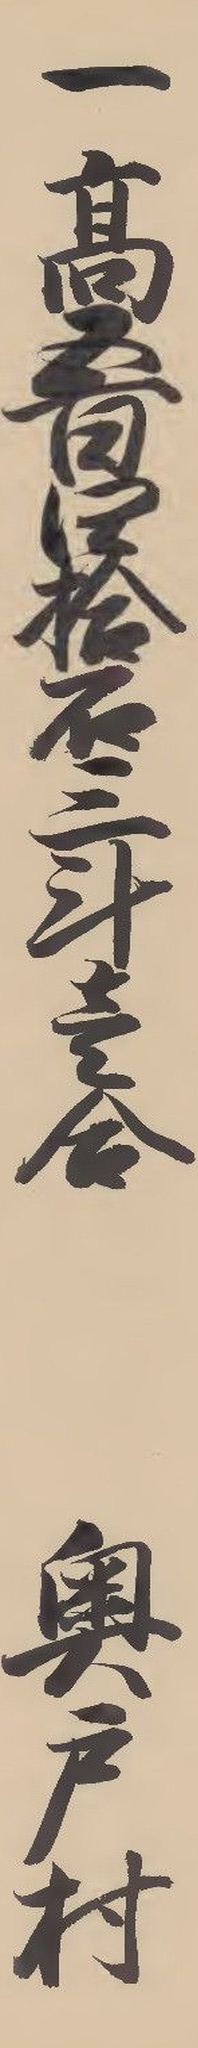一高五百四拾石三斗壱合奥戸村
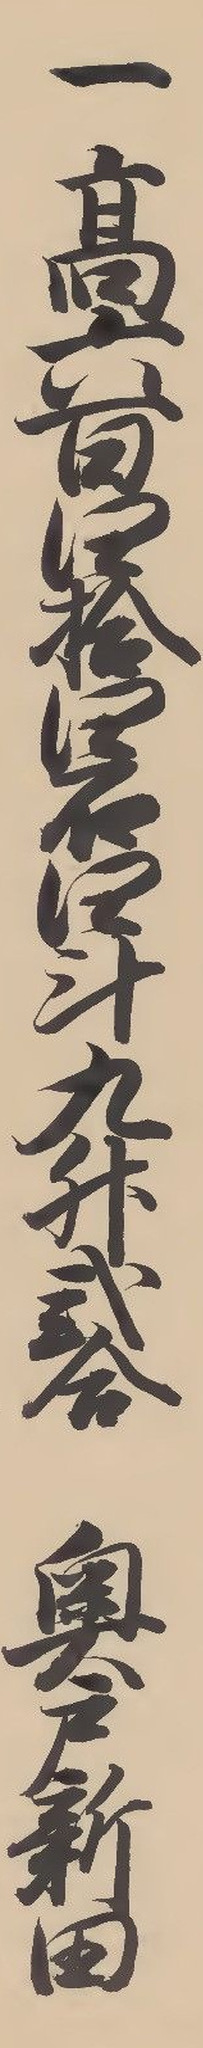一高六百四拾四石四斗九升弐合奥戸新田
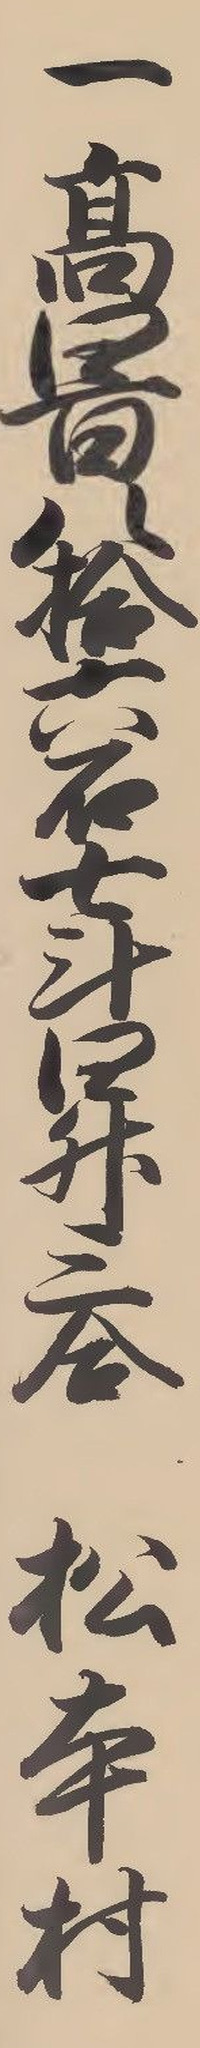一高四百八拾六石七斗四升三合松本村
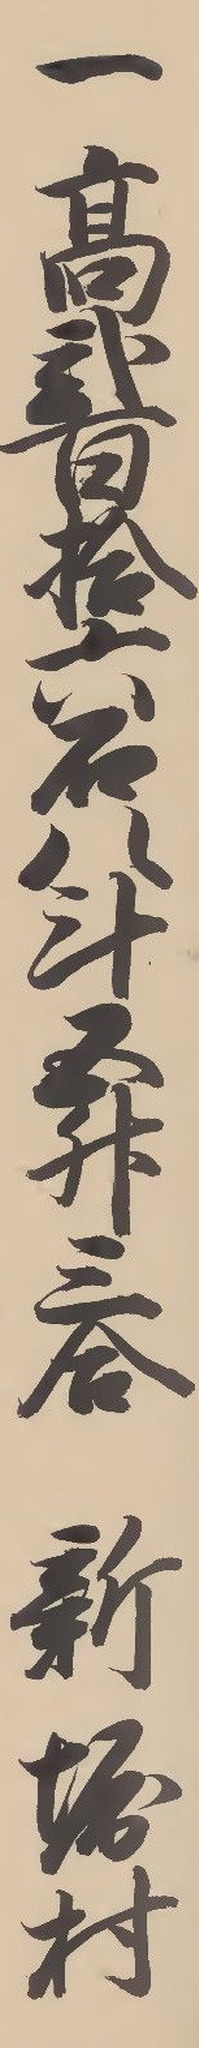一高弐百拾六石八斗五升三合新堀村
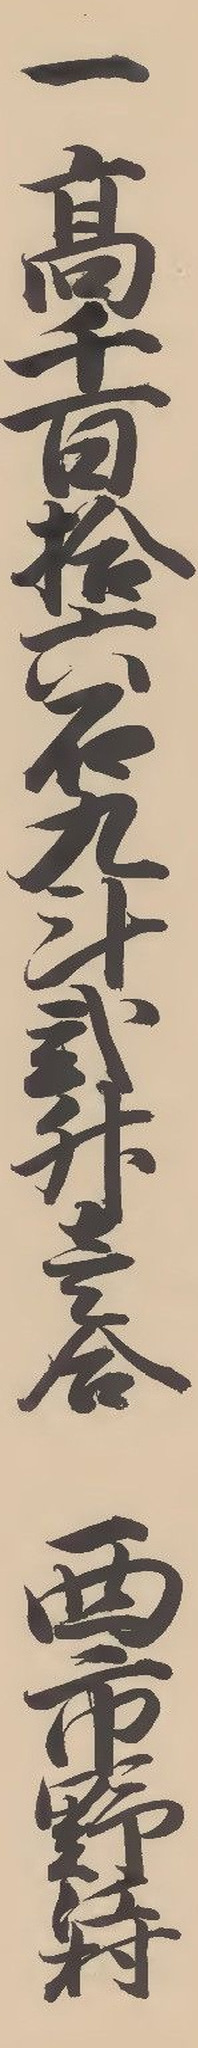一高千百拾六石九斗弐升壱合西市野江村
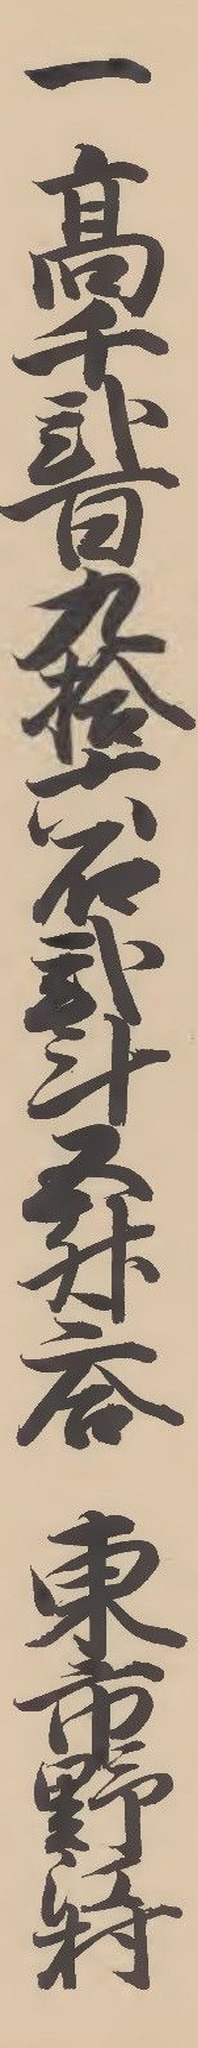一高千弐百九拾六石弐斗五升三合東市野江村
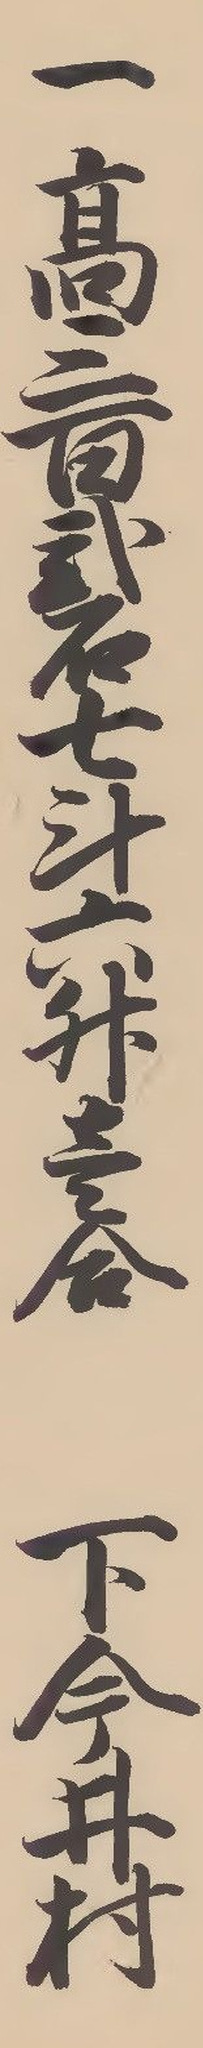一高三百弐石七斗六升壱合下今井村

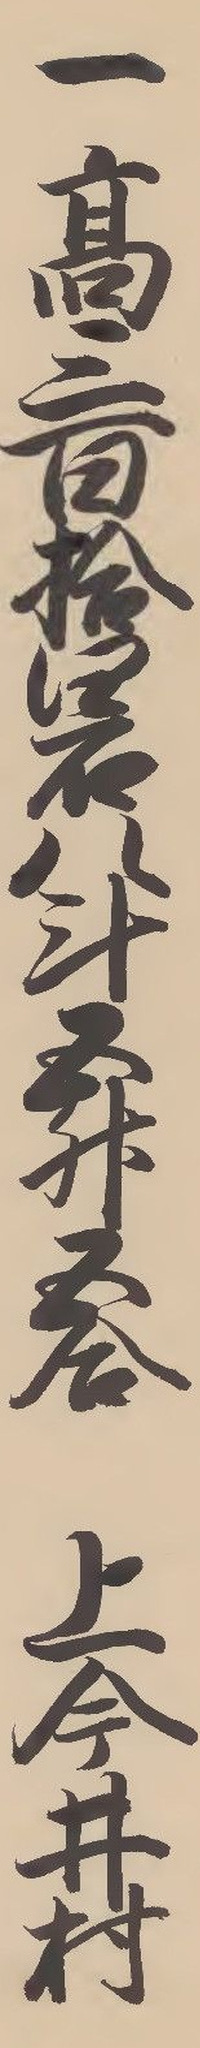一高三百拾四石八斗五升五合上今井村
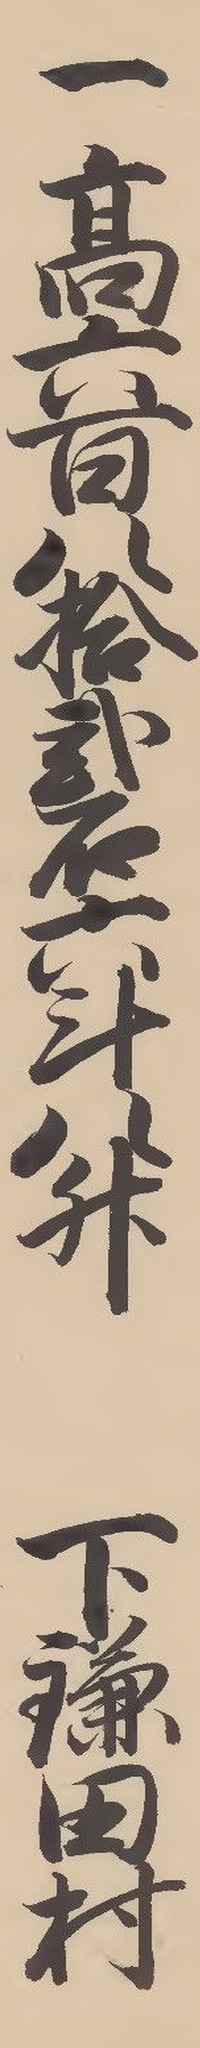一高六百八拾弐石六斗八升下鎌田村
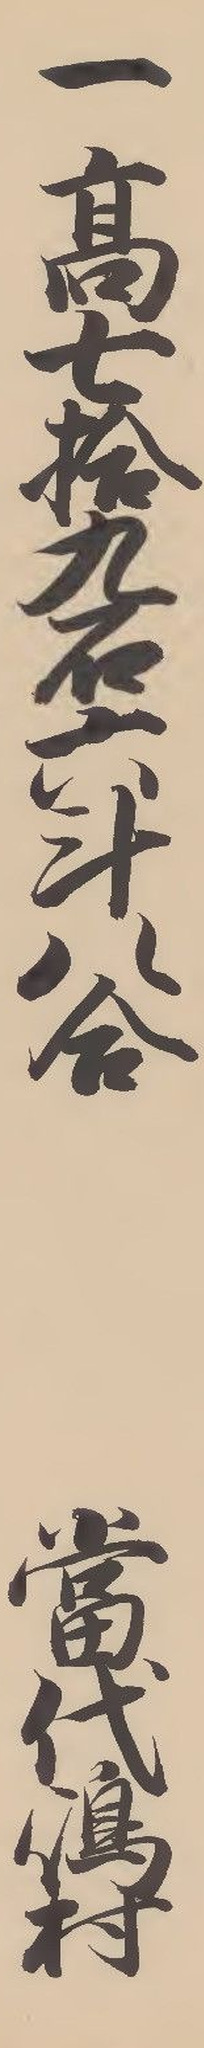一高七拾九石六斗八合当代嶋村
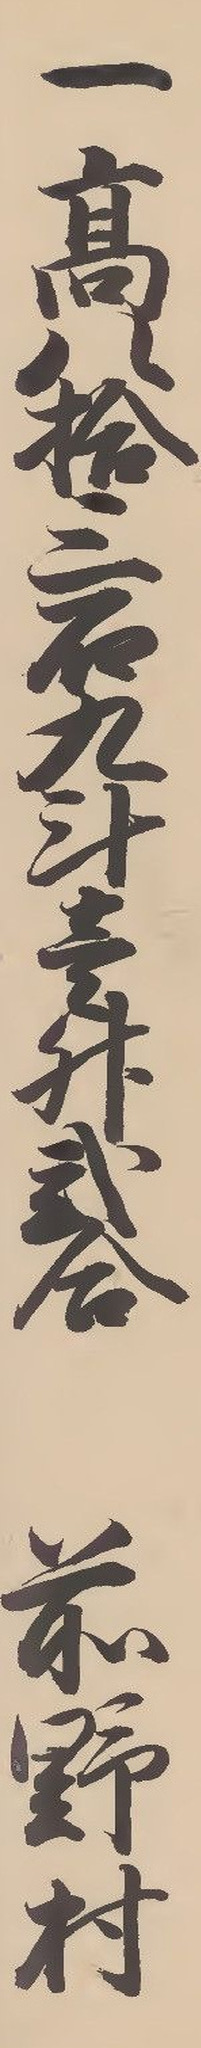一高八拾三石九斗壱升弐合前野村
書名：武蔵国郷帳　下
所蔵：国立公文書館 National Archives of Japan
